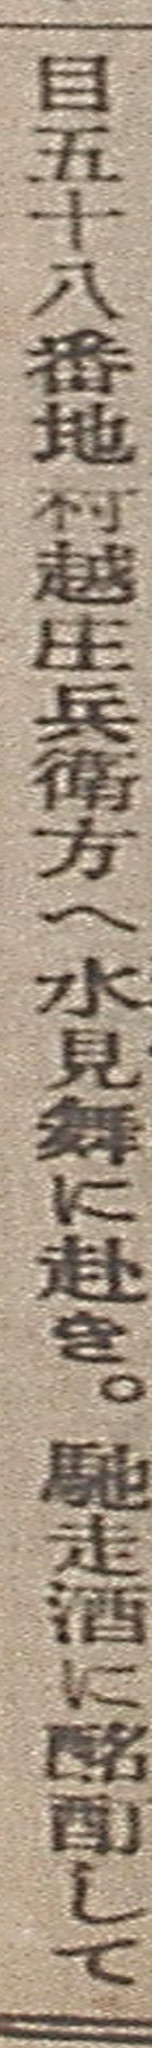目五十八番地村越庄兵衛方へ水見舞に赴き。馳走酒に酩酊して

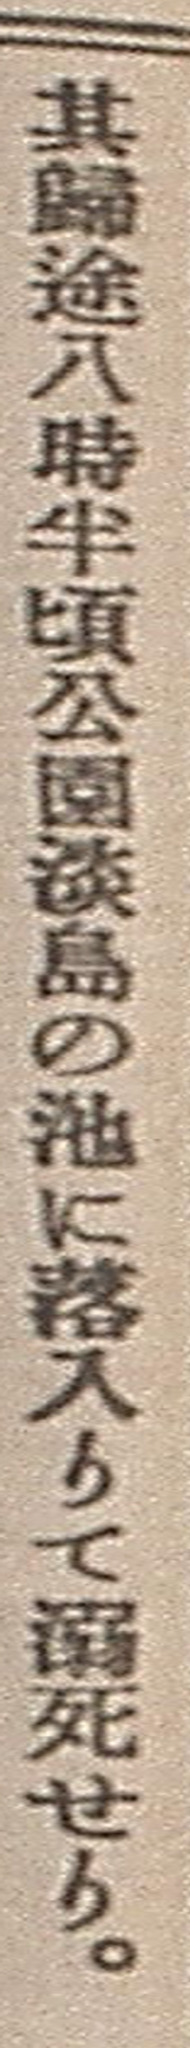其帰途八時半頃公園淡島の池に落入りて溺死せり。
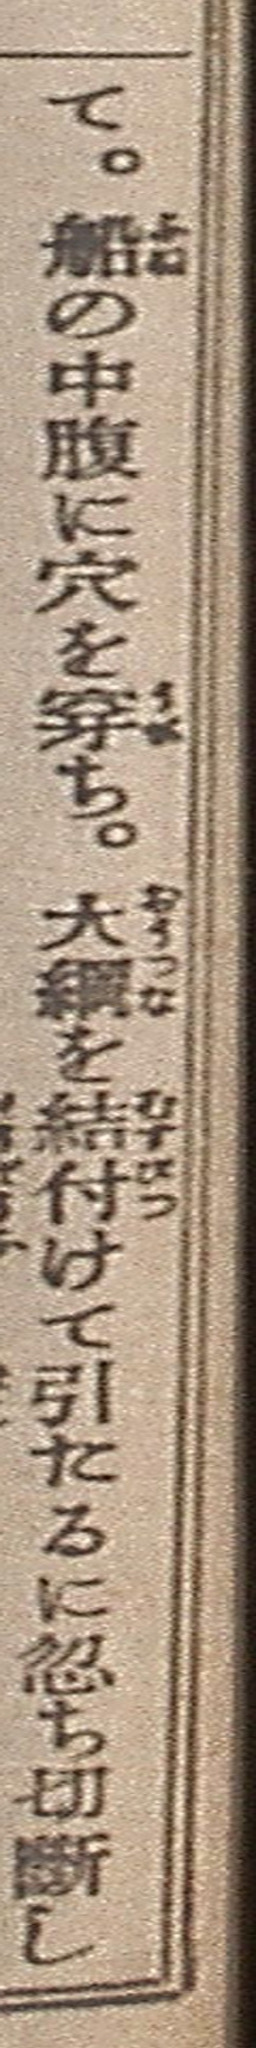て。船の中腹に穴を穿ち。大綱を結付けて引たるに忽ち切断し
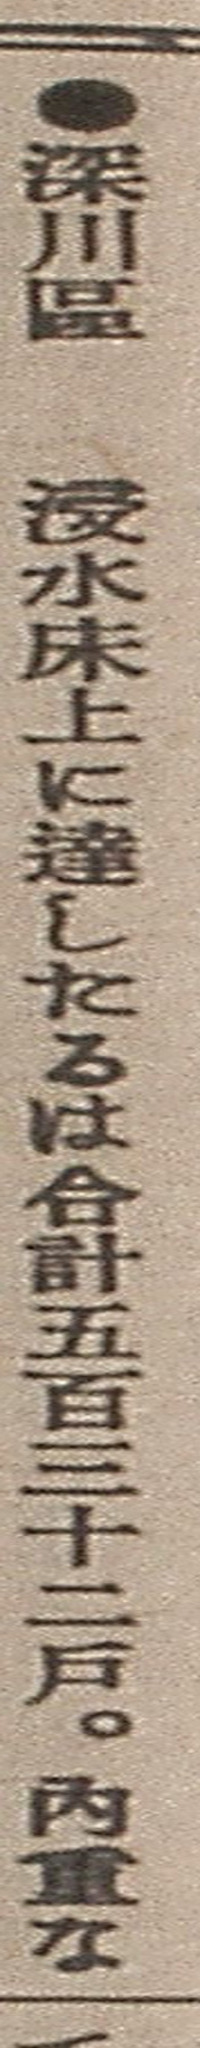●深川区浸水床上に達したるは合計五百三十二戸。内重な
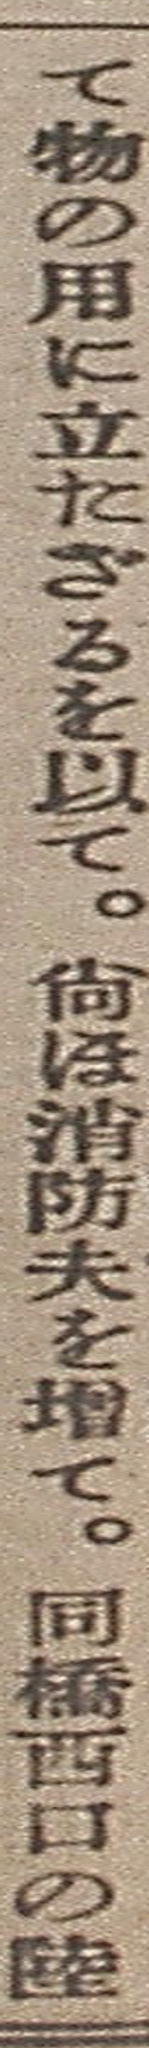て物の用に立たざるを以て。尚ほ消防夫を増て。同橋西口の陸
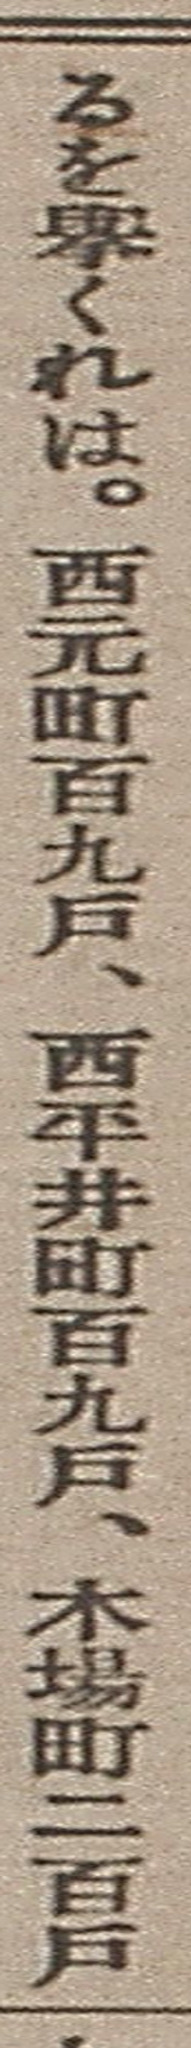るを挙くれは。西元町百九戸、西平井町百九戸、木場町二百戸
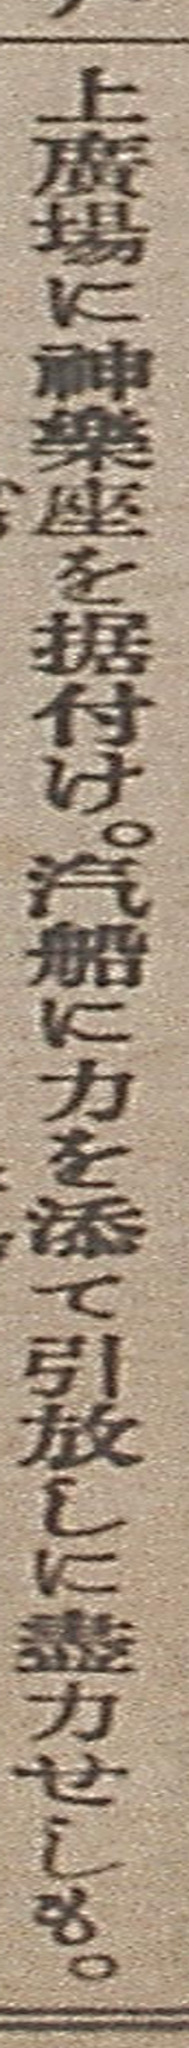上広場に神楽座を据付け。汽船に力を添て引放しに尽力せしも。
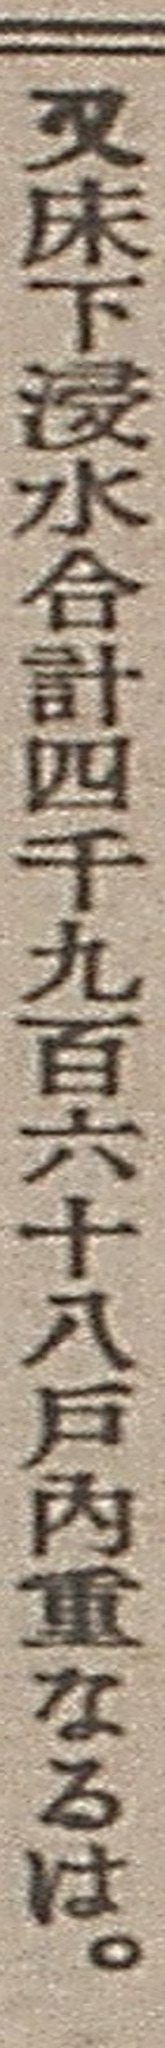又床下浸水合計四千九百六十八戸内重なるは。
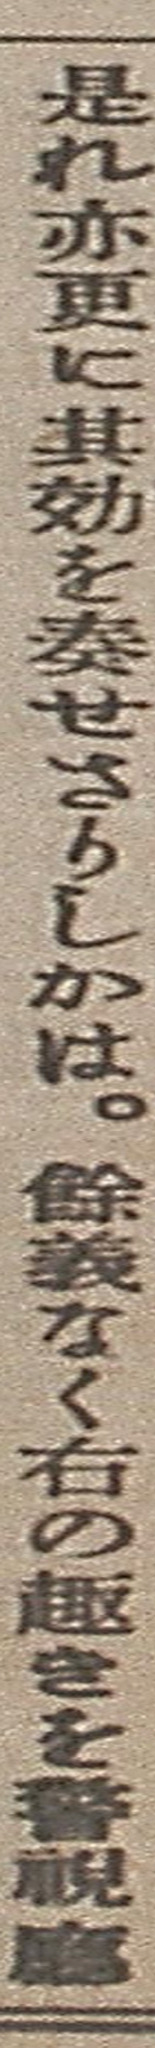是れ亦更に其効を奏せさりしかは。余義なく右の趣きを警視庁
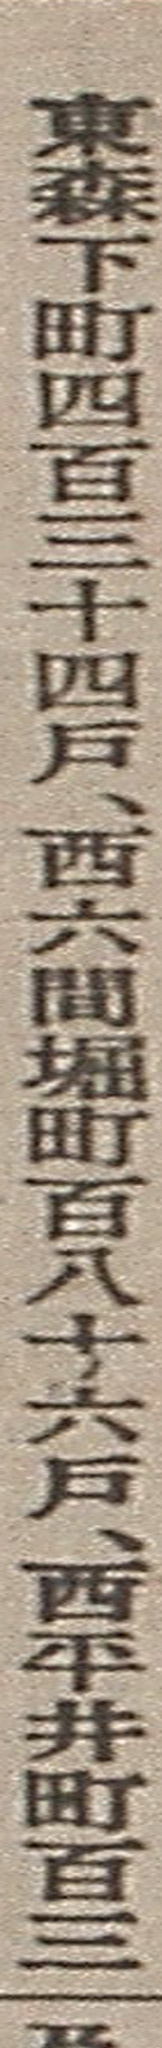東森下町四百三十四戸、西六間堀町百八十六戸、西平井町百三
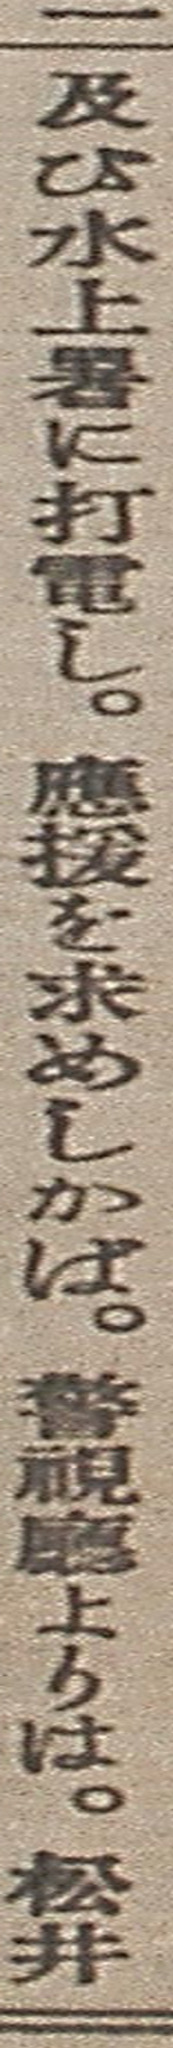及び水上署に打電し。応援を求めしかば。警視庁よりは。松井
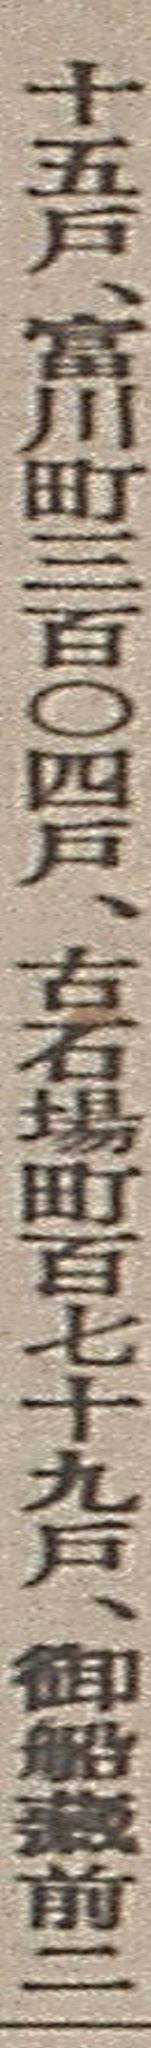十五戸、富川町三百〇四戸、古石場町百七十九戸、御船蔵前二
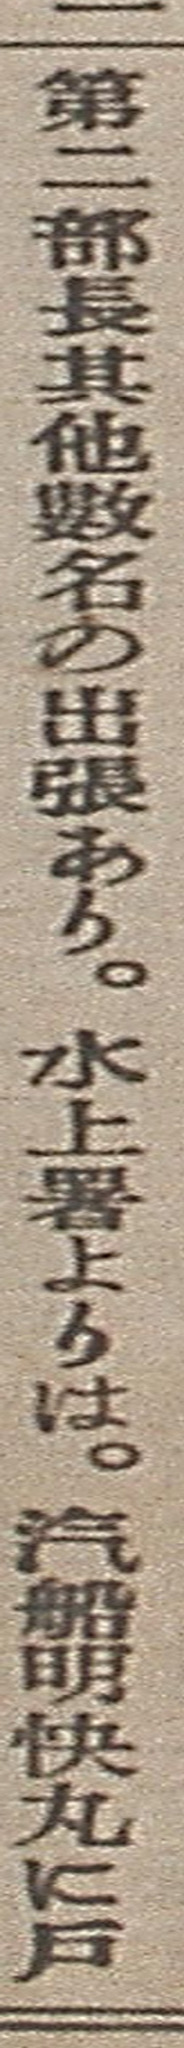第二部長其他数名の出張あり。水上署よりは。汽船明快丸に戸
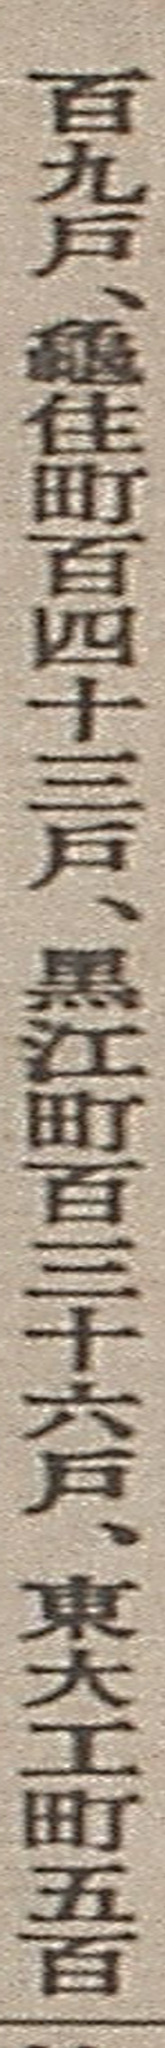百九戸、亀住町百四十三戸、黒江町百三十六戸、東大工町五百
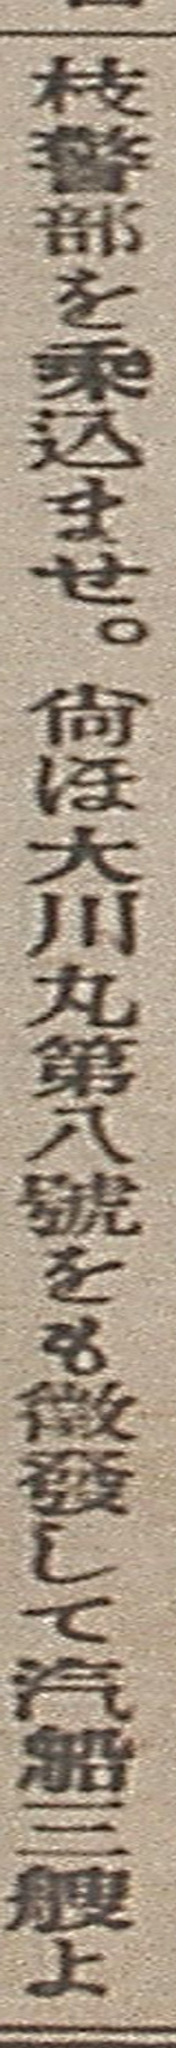枝警部を乗込ませ。尚ほ大川丸第八号をも徴発して汽船三艘よ
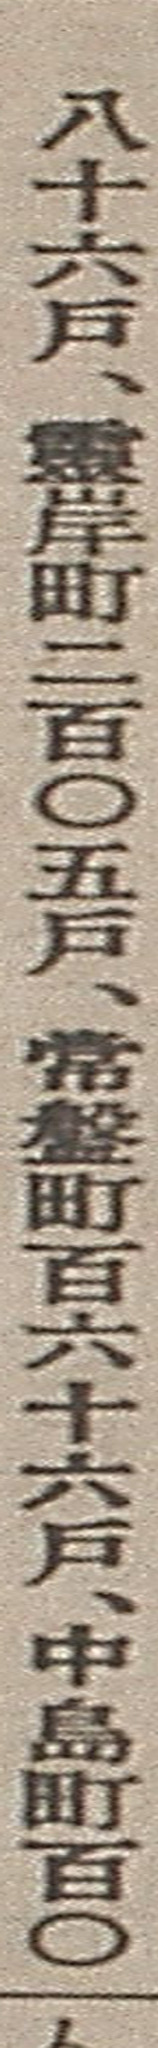八十六戸、霊岸町二百〇五戸、常盤町百六十六戸、中島町百〇
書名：風俗畫報臨時増刊第百九十九號　明治三十二年十月各地災害圖會（前編之續）
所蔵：東京大学地震研究所図書室 Earthquake Research Institute Library, The University of Tokyo, JAPAN
